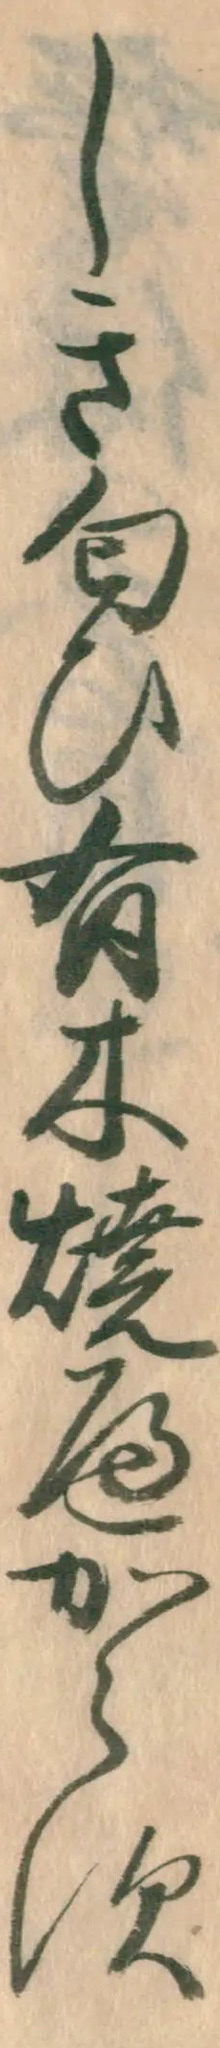悪しき匂ひ有木焼へからす
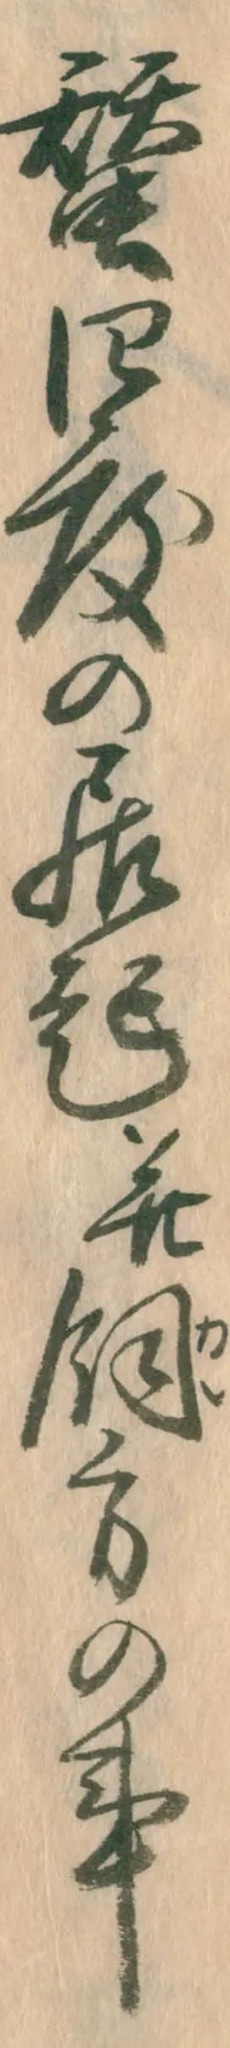蚕四度の居起并飼方の事
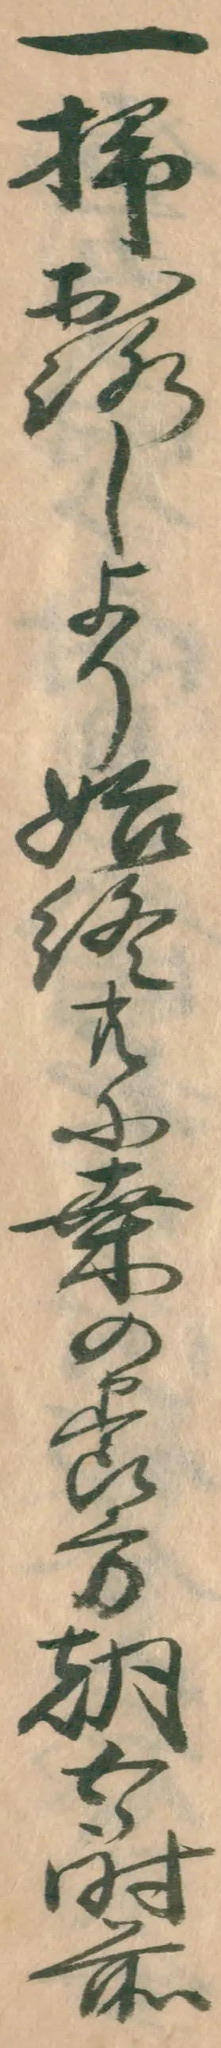一掃おろしより始終共に桑の養方朝五つ時前

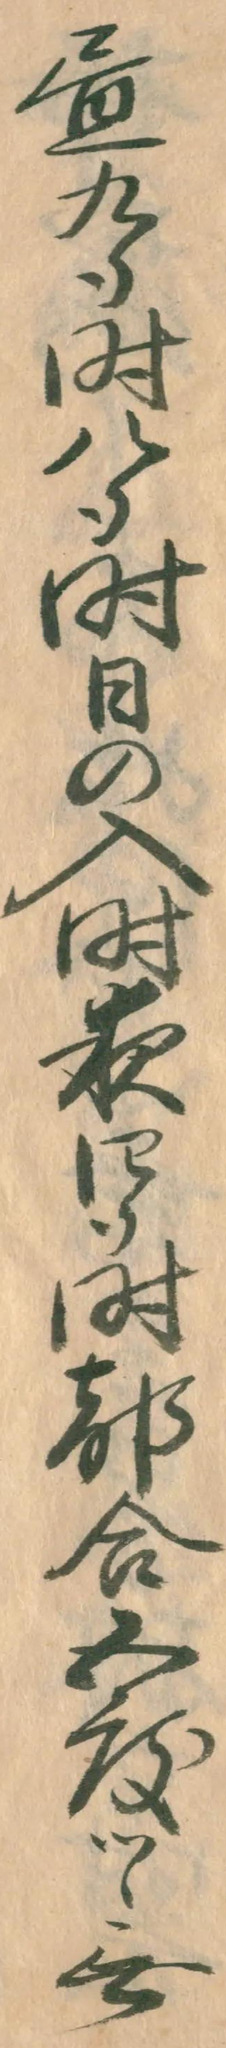昼九つ時八つ時日の入時夜四つ時都合五度つゝ無
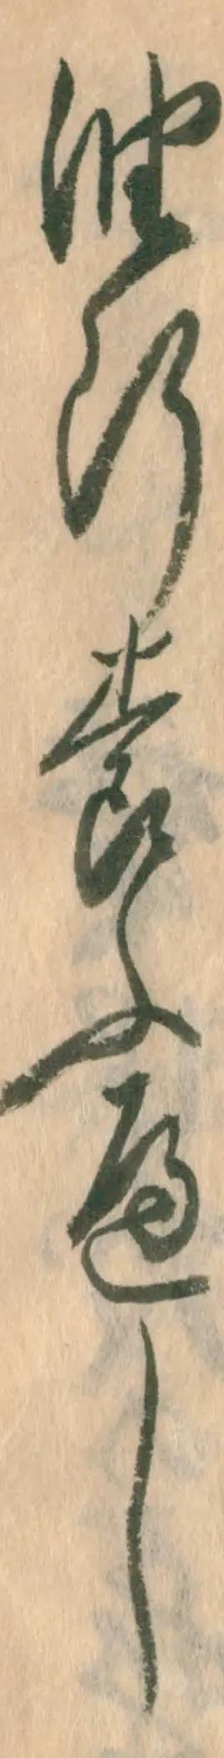油断養ふへし
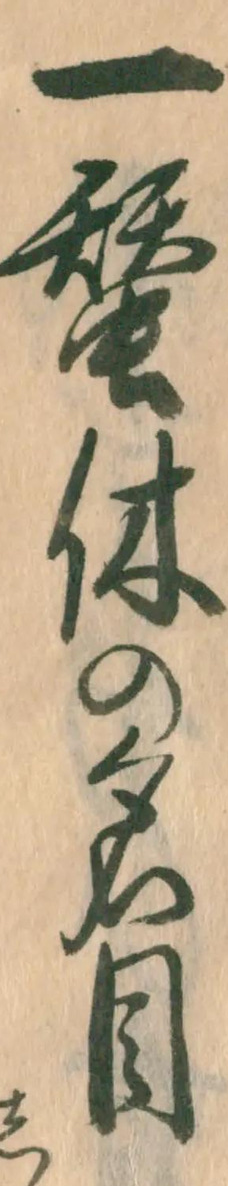一蚕休の名目
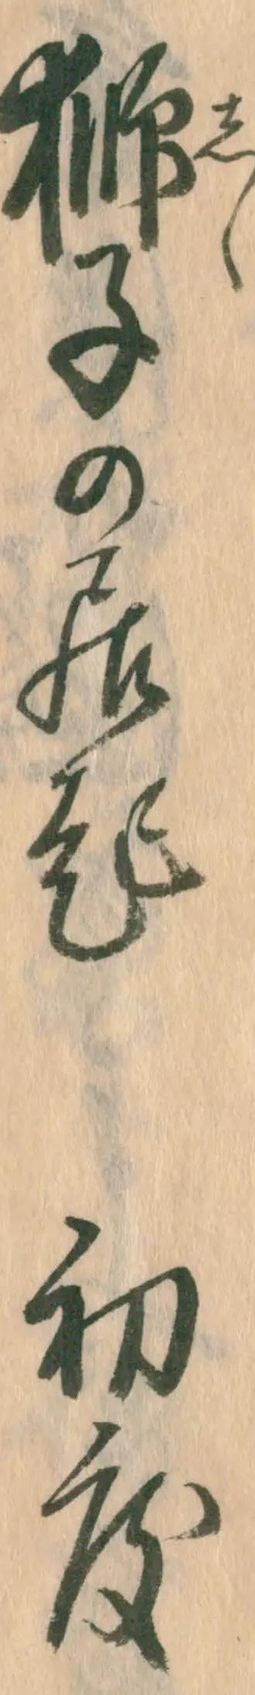獅子の居起初度
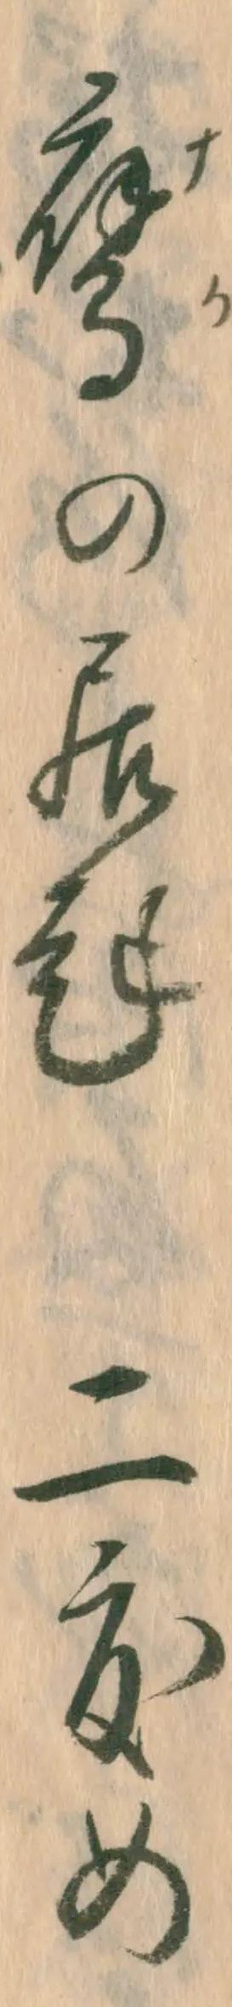鷹の居起二度め
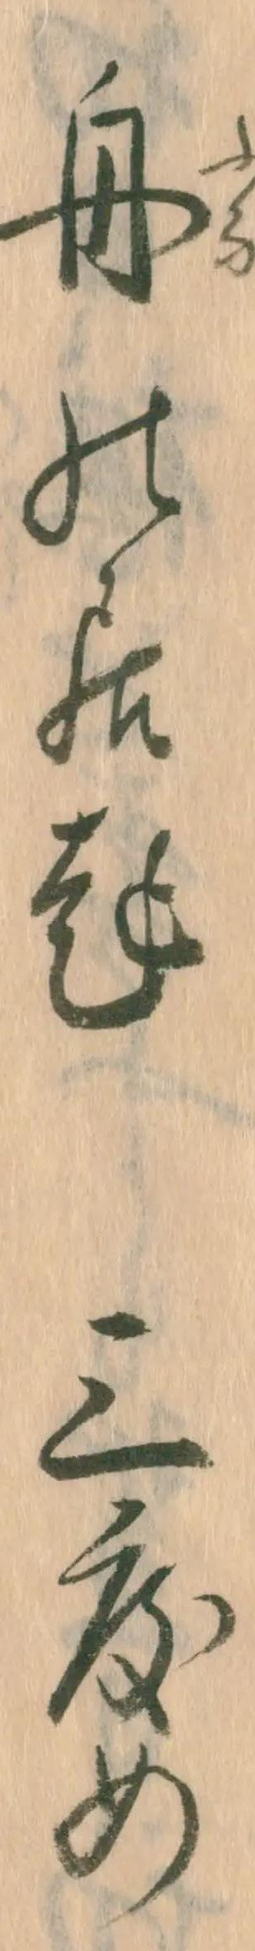舟の居起三度め
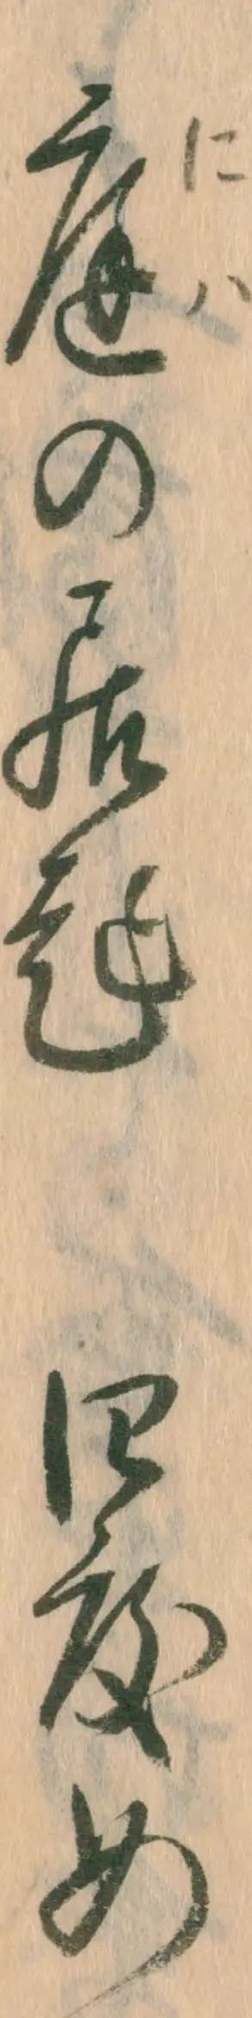庭の居起四度め
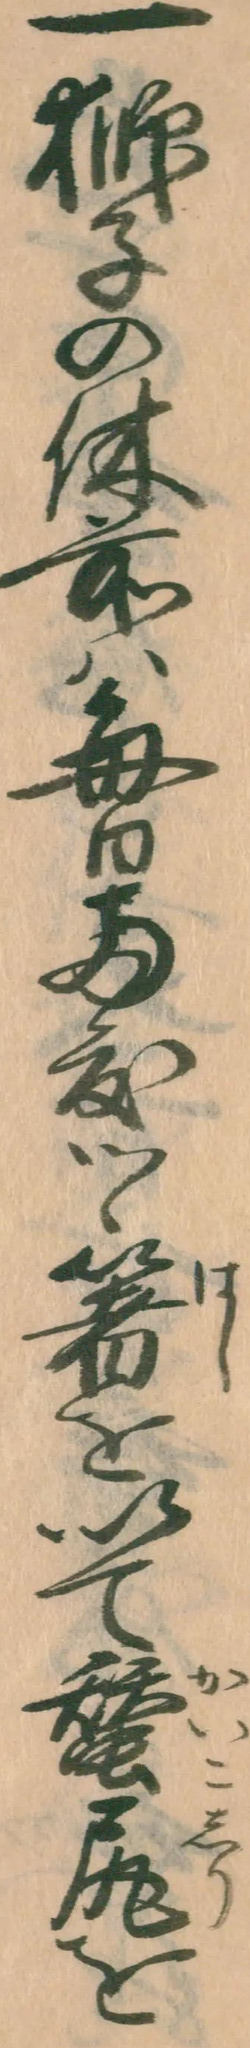一獅子の休前は毎日両度つゝ箸を以て蚕尻を
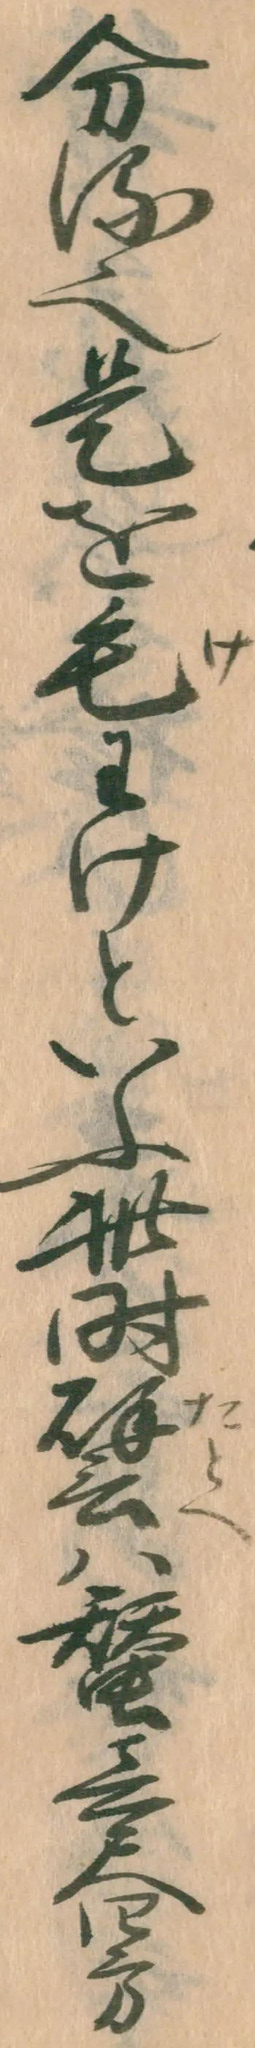分る也是を毛わけといふ此時譬は蚕一尺四方
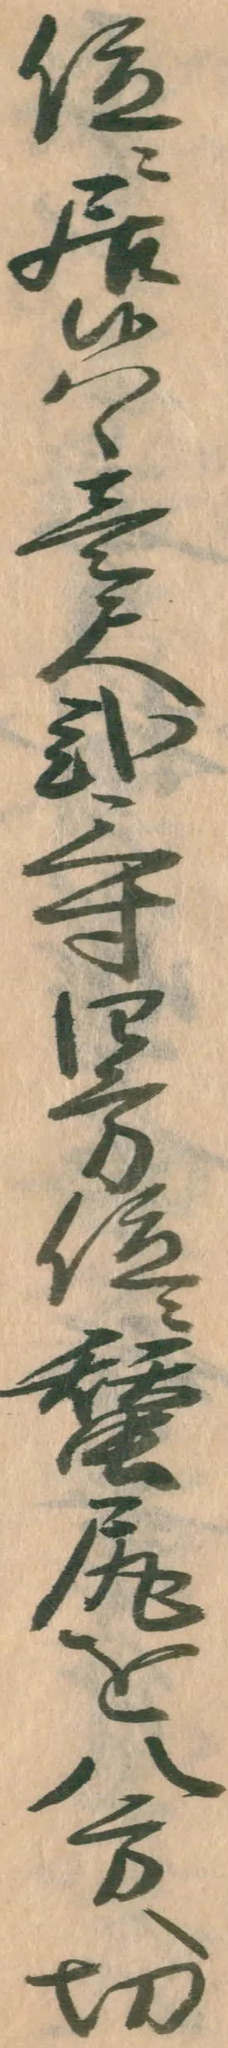位に居候はゝ壱尺弐三寸四方位に蚕尻を八方へ切
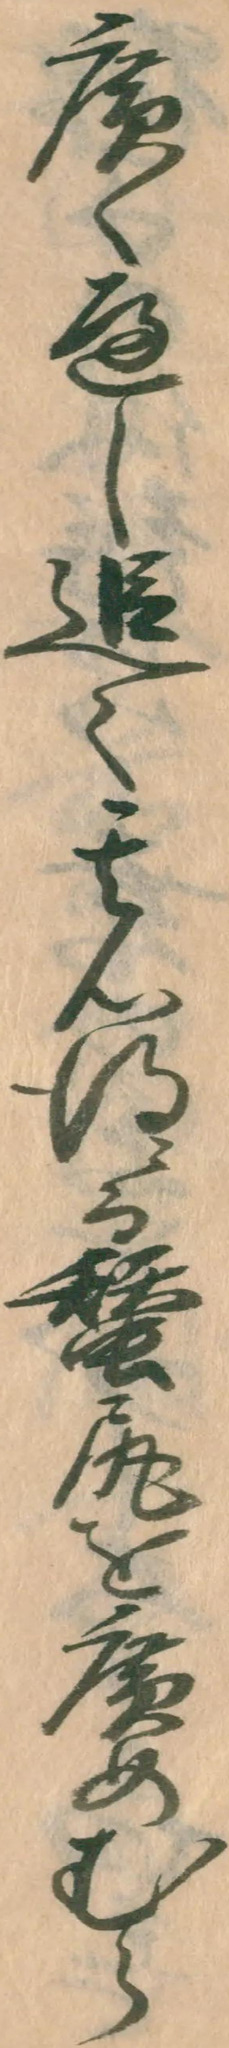広くへし追々其心得にて蚕尻を広めむら
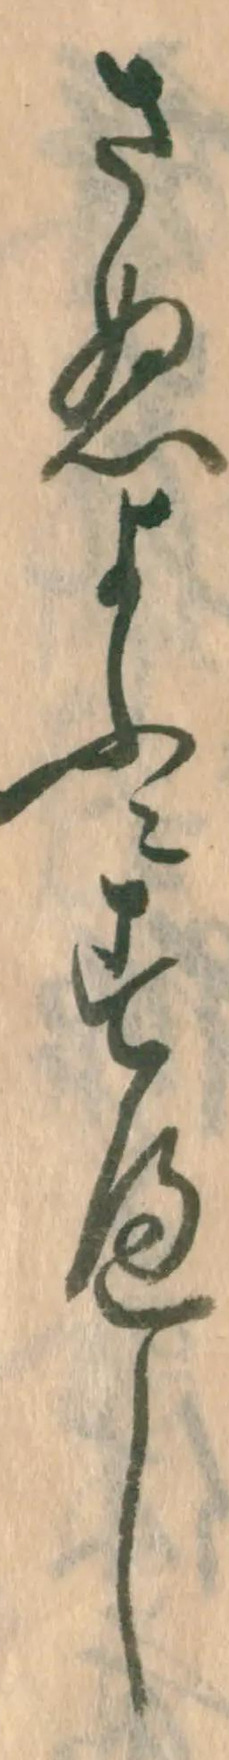さぬよふにすへし
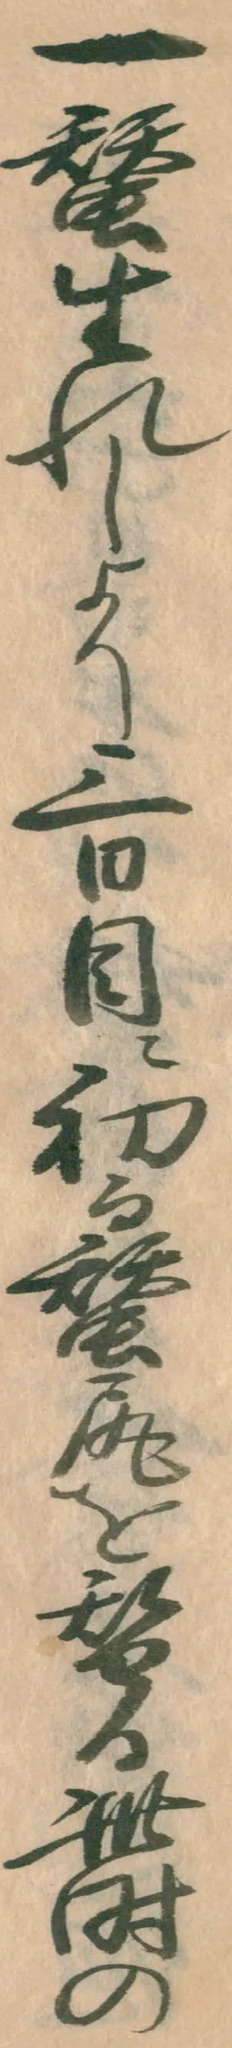一蚕生まれしより三日目に初て蚕尻を替る此時の
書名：養蚕録
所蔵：国立国会図書館 National Diet Library, JAPAN
